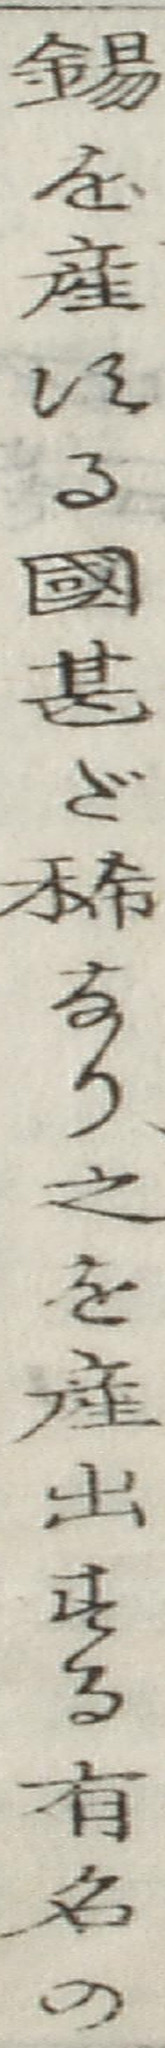錫を産する国甚だ稀なり、之を産出する有名の
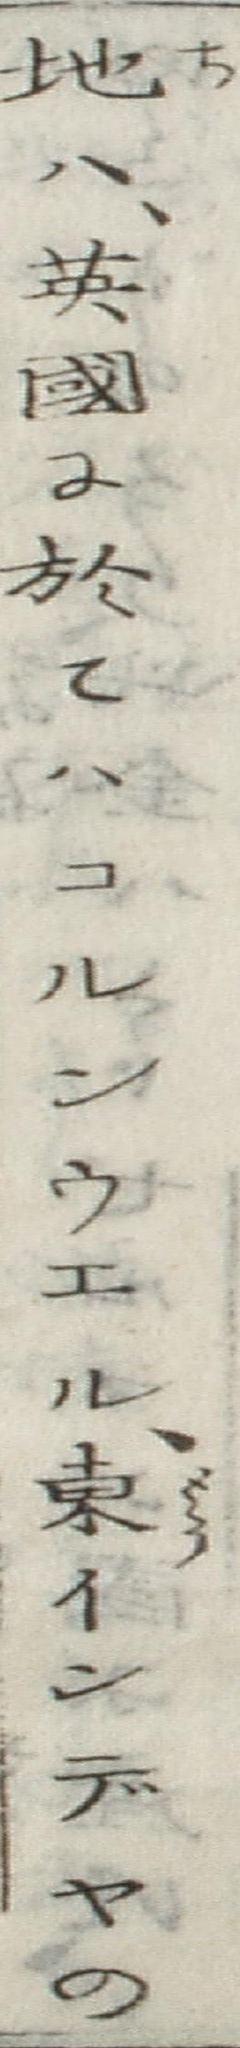地は、英国に於てはコルンウエル、東インデヤの
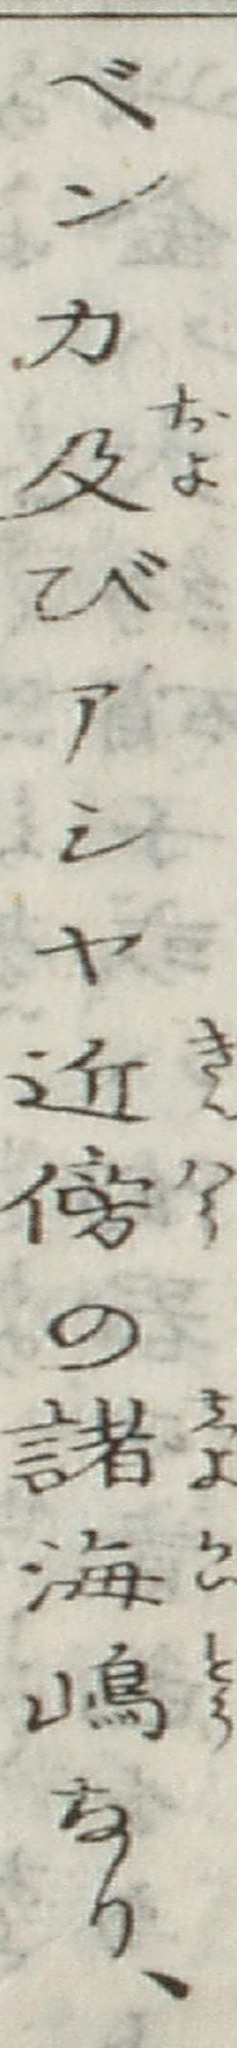ベンカ及びアシヤ近傍の諸海島なり、
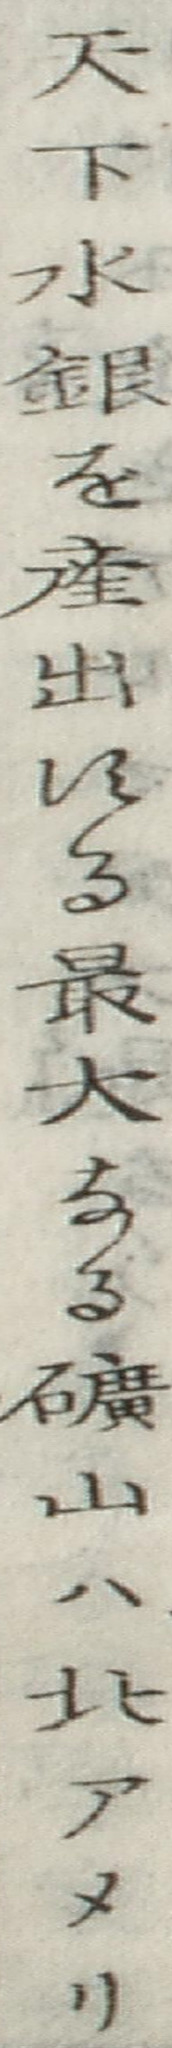天下水銀を産出する最大なる鉱山は、北アメリ
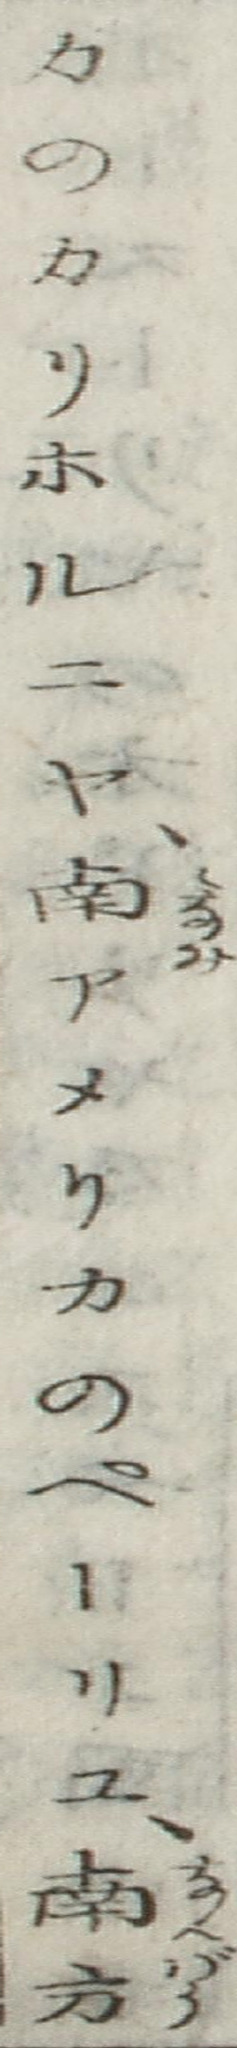カのカリホルニヤ、南アメリカのペーリユ、南方

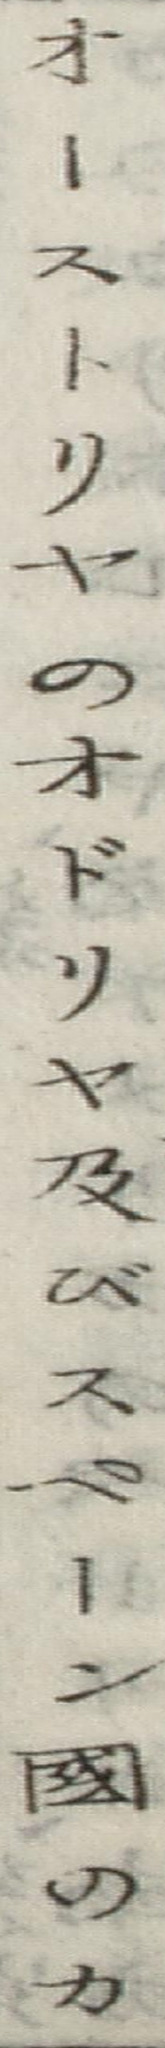オーストリヤのオドリヤ及びスペーン国のカ
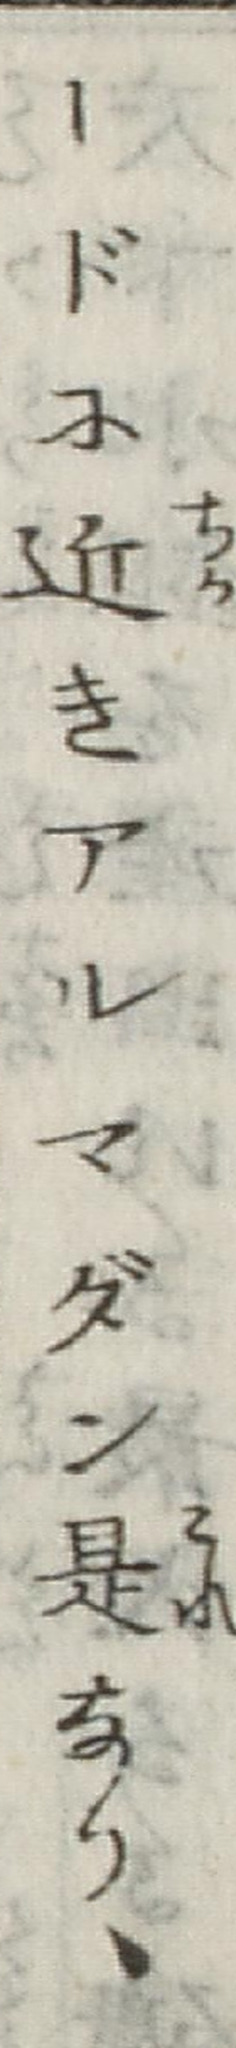ードに近きアルマダン是なり、
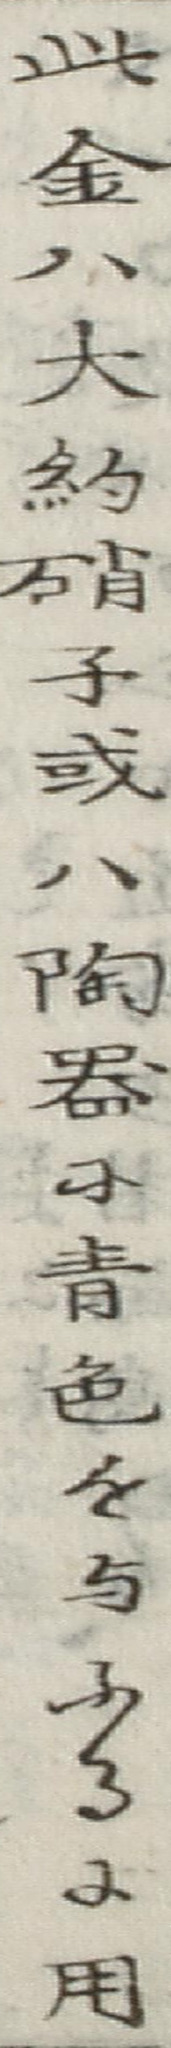此金は大約硝子或は陶器に青色を与ふるに用
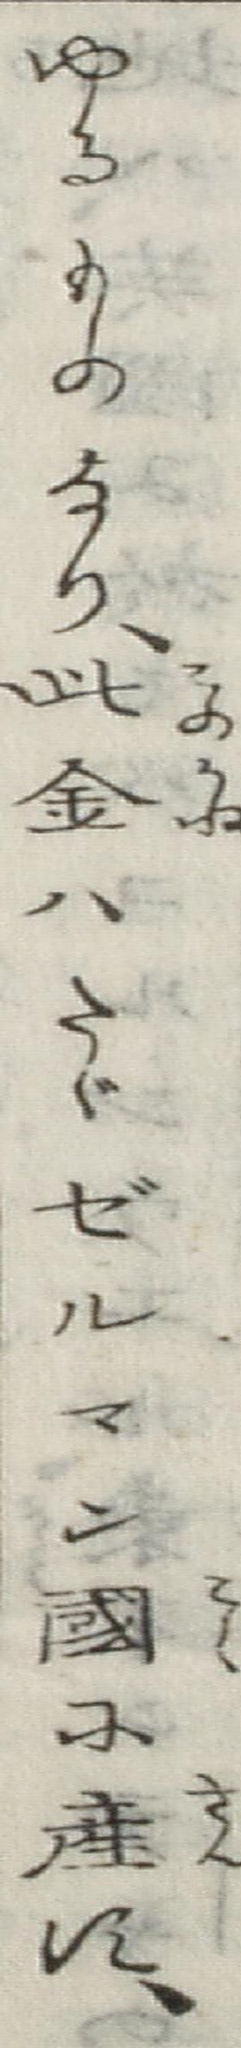ゆるものなり、此金はたゞゼルマン国に産す、
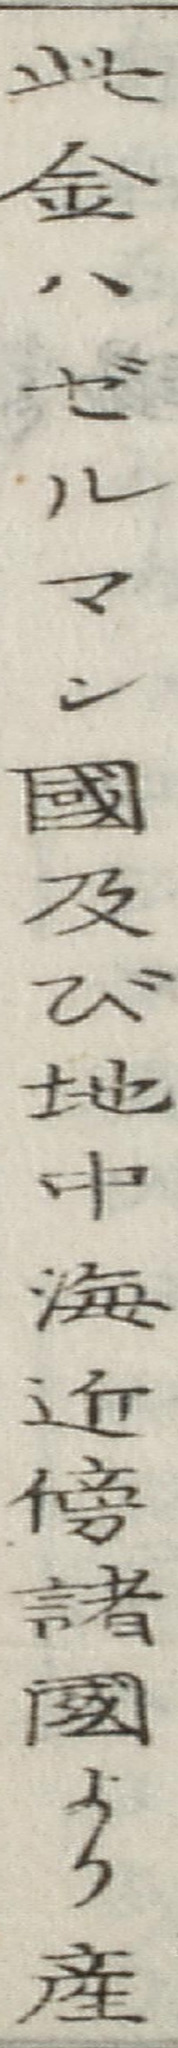此金はゼルマン国及び地中海近傍諸国より産
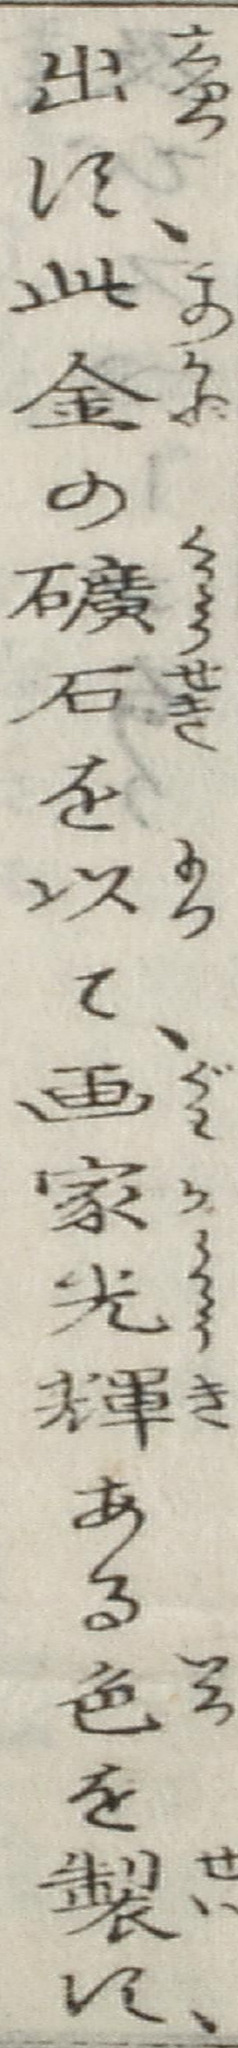出す、此金の砿石を以て、画家光輝ある色を製す、
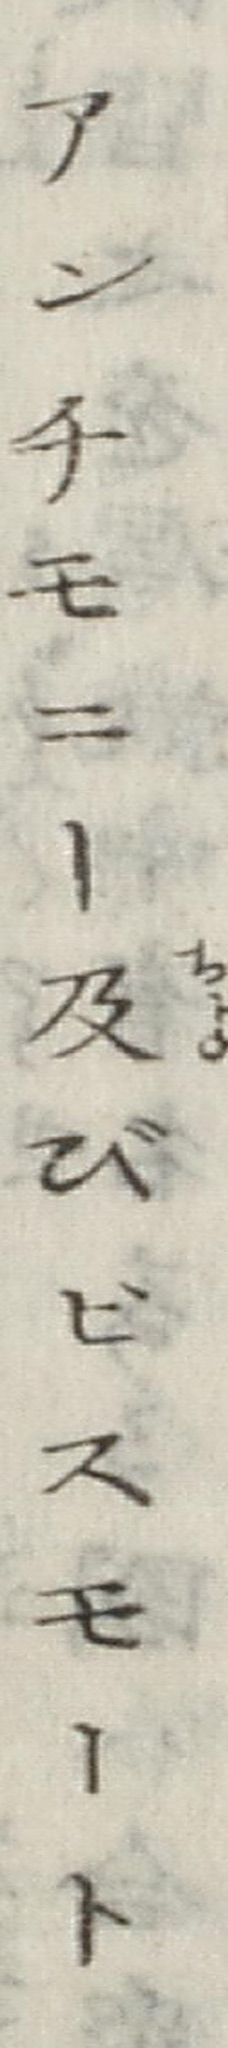○アンチモニー及びビスモート
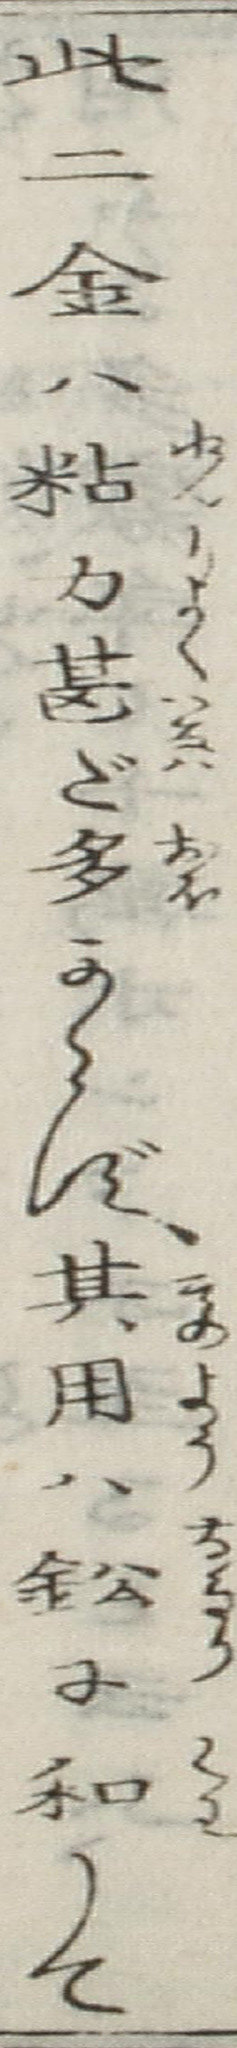此二金は粘力甚だ多からず、其用は鉛に和して
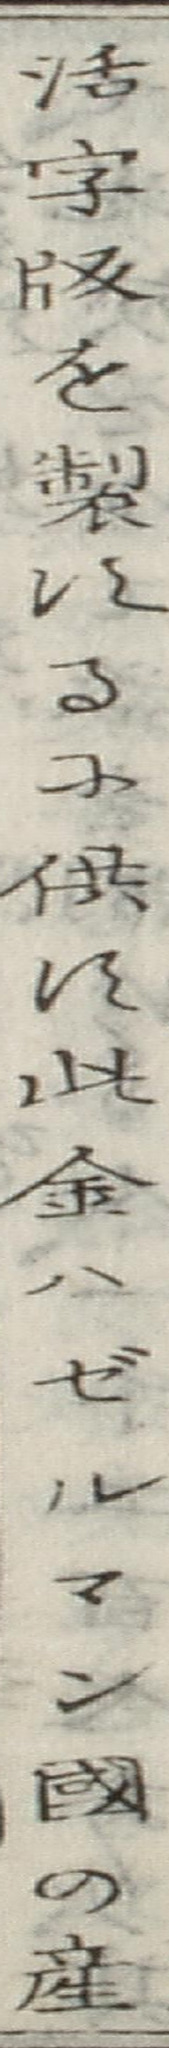活字版を製するに供す、此金はゼルマン国の産
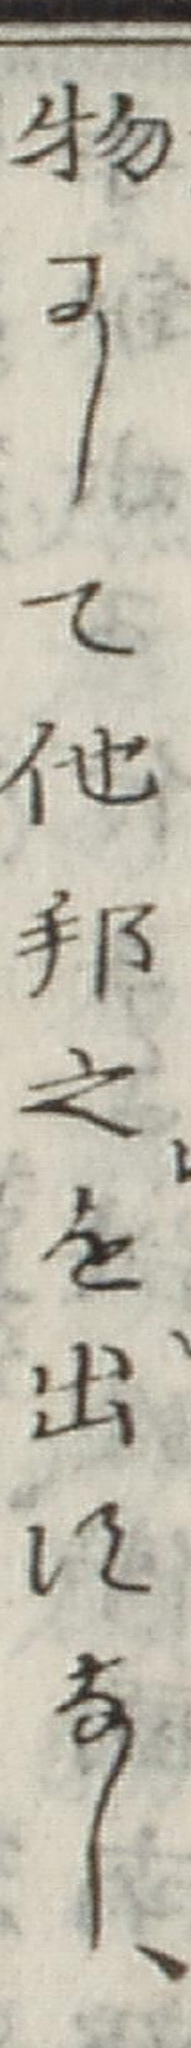物にして他邦之を出すなし、
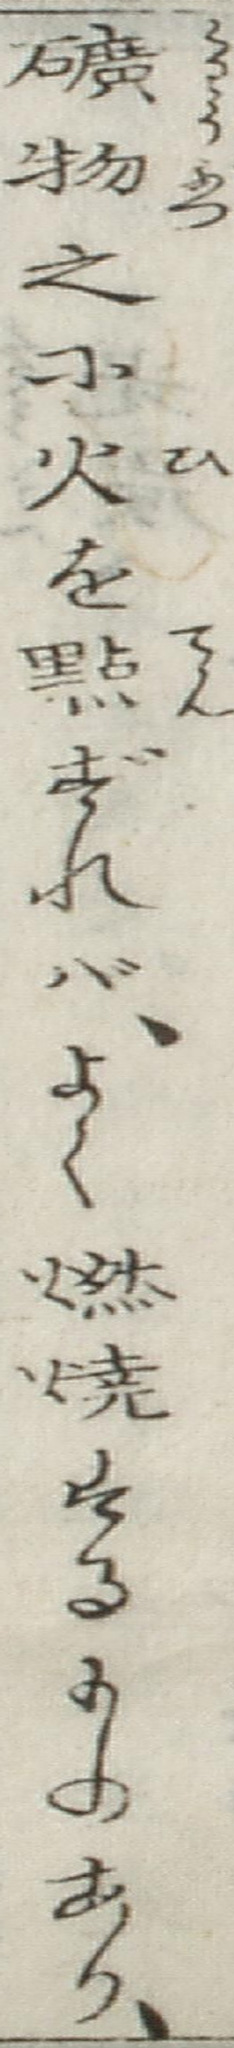砿物之に火を点ずれば、よく燃焼するものあり、
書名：訓蒙　天然地理學　下
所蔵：東京大学地震研究所図書室 Earthquake Research Institute Library, The University of Tokyo, JAPAN
